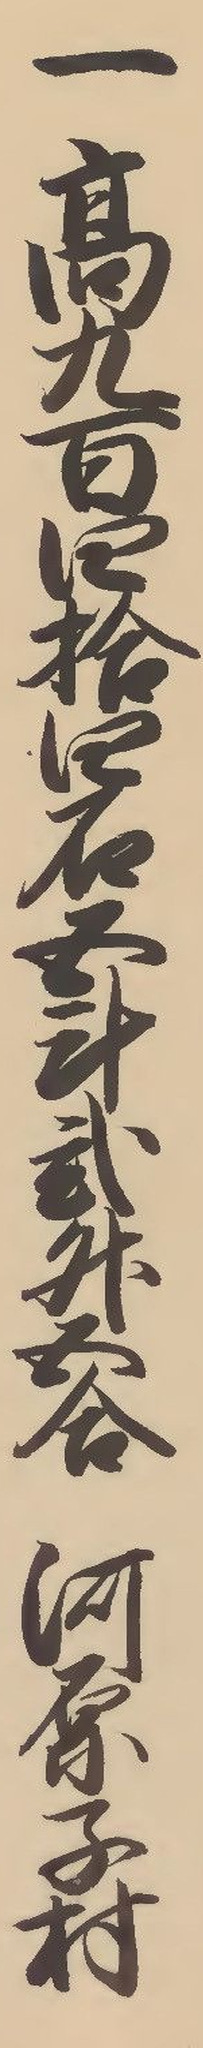一高九百四拾四石五斗弐升五合河原子村
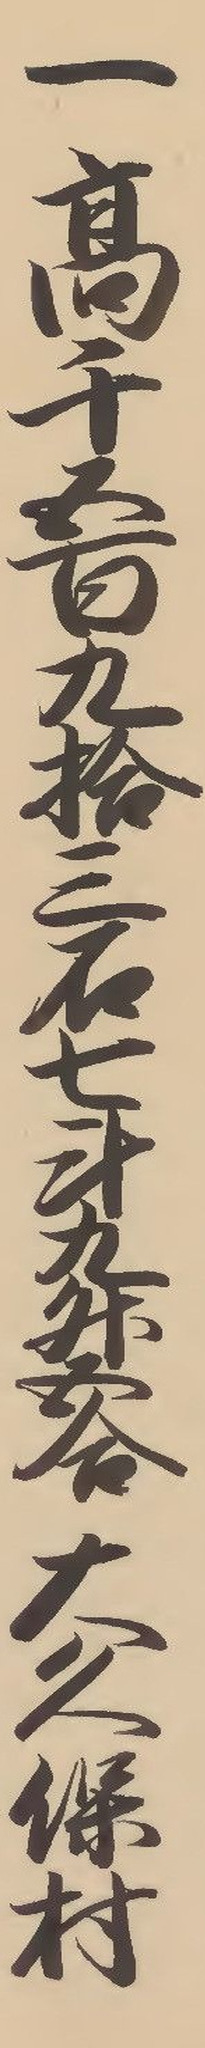一高千五百九拾三石七斗九升五合大久保村
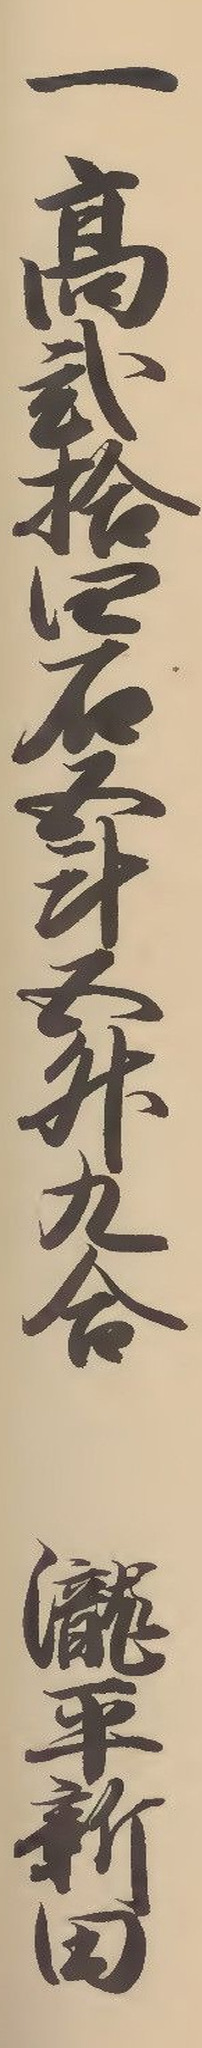一高弐拾四石五斗五升九合滝平新田
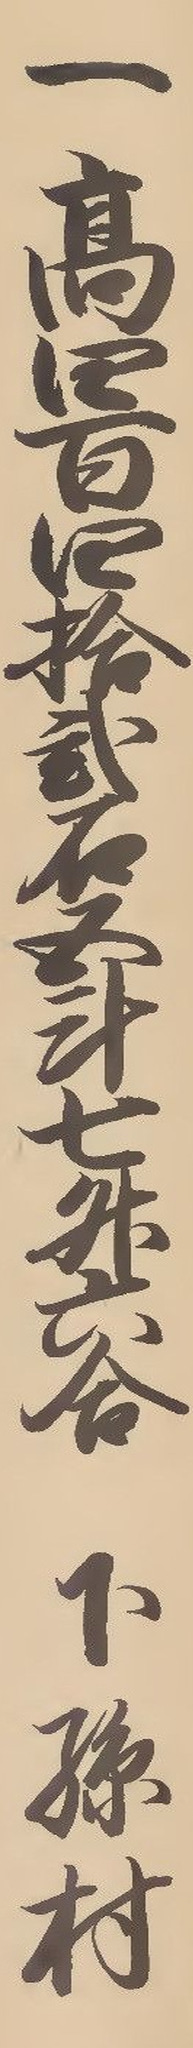一高四百四拾弐石五斗七升六合下孫村
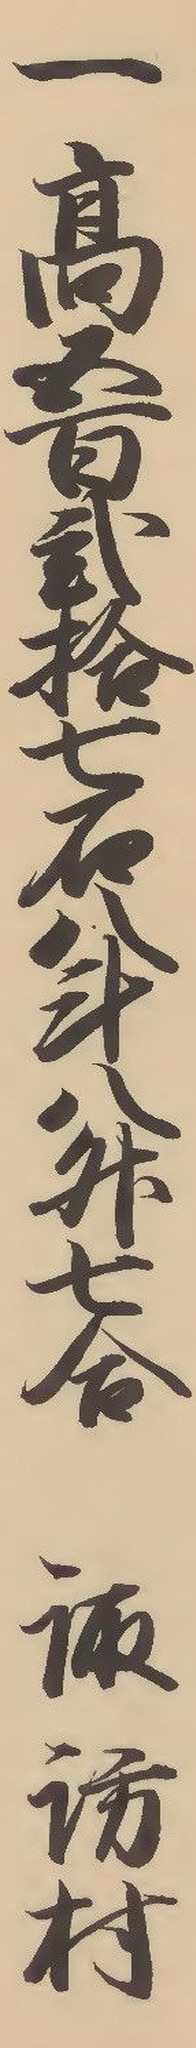一高五百弐拾七石八斗八升七合諏訪村
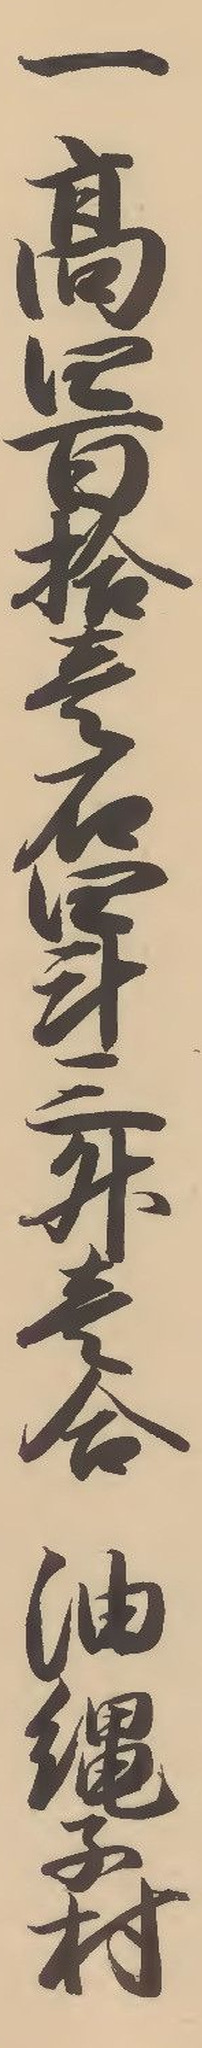一高四百拾壱石四斗三升壱合油縄子村
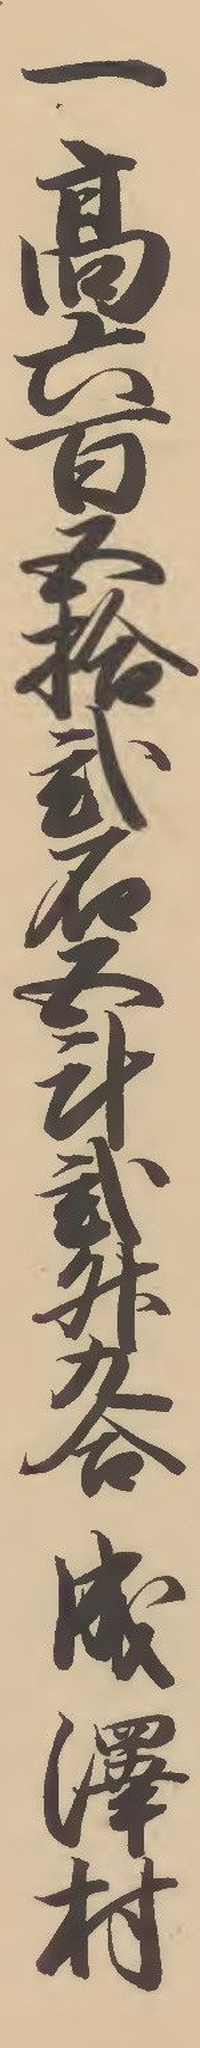一高六百五拾弐石五斗弐升九合成沢村

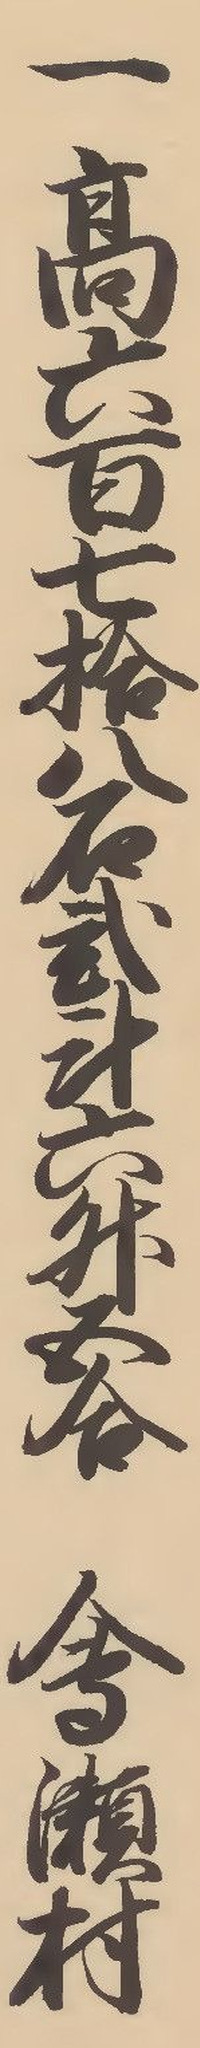一高六百七拾八石弐斗六升五合会瀬村
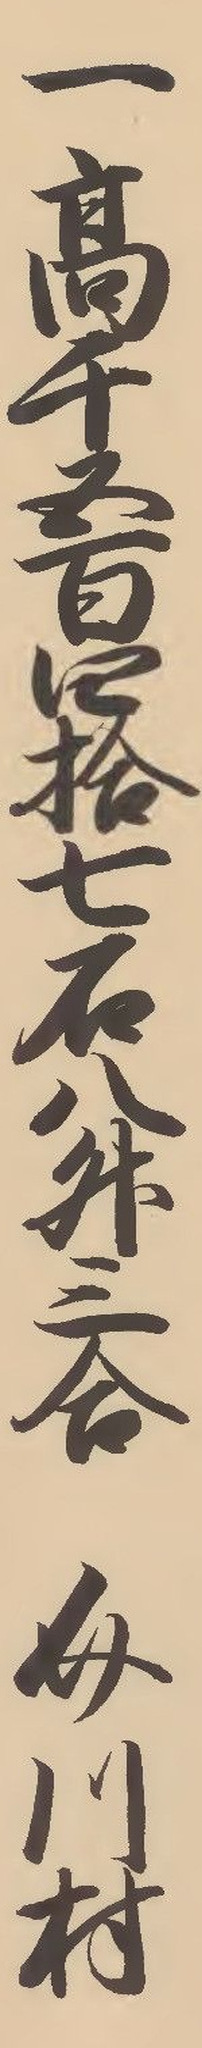一高千五百四拾七石八升三合介川村
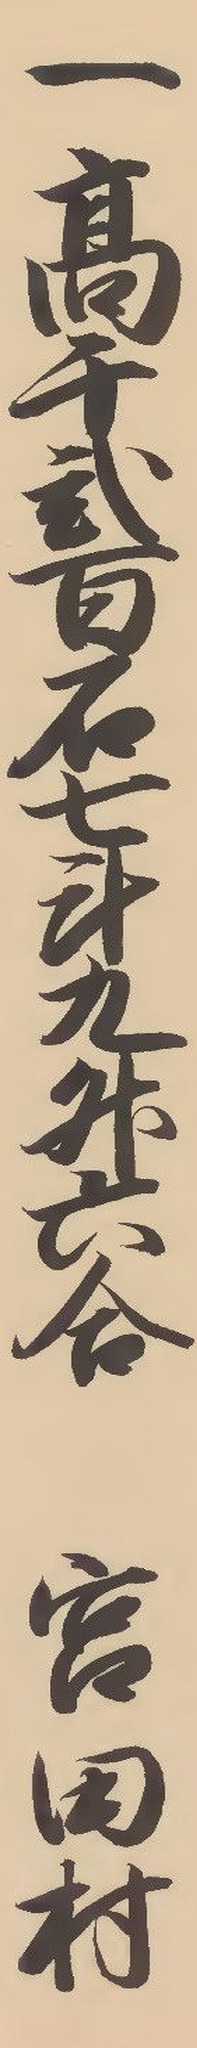一高千弐百石七斗九升六合宮田村
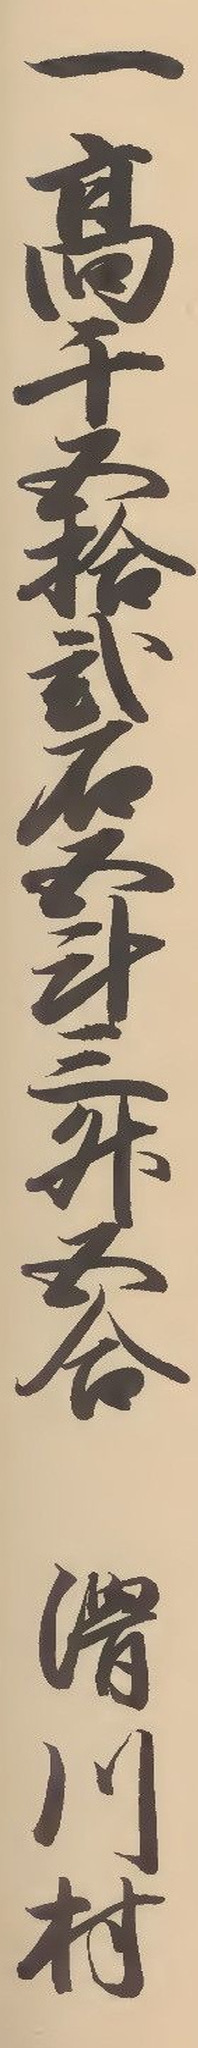一高千五拾弐石五斗三升五合滑川村
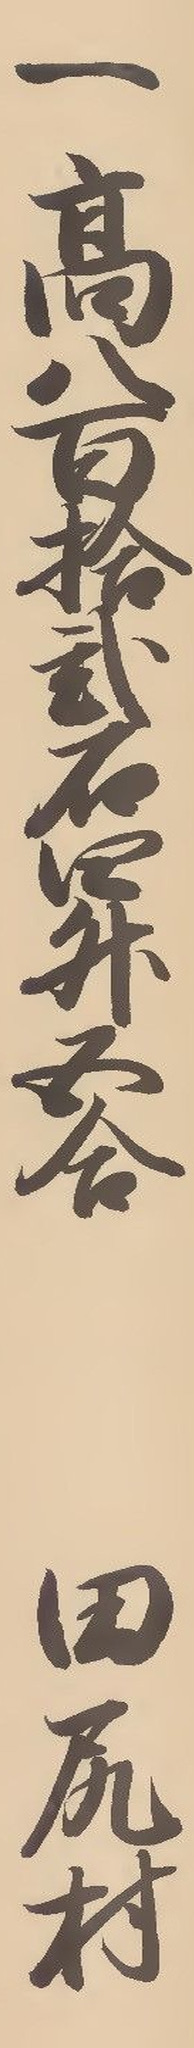一高八百拾弐石四升五合田尻村
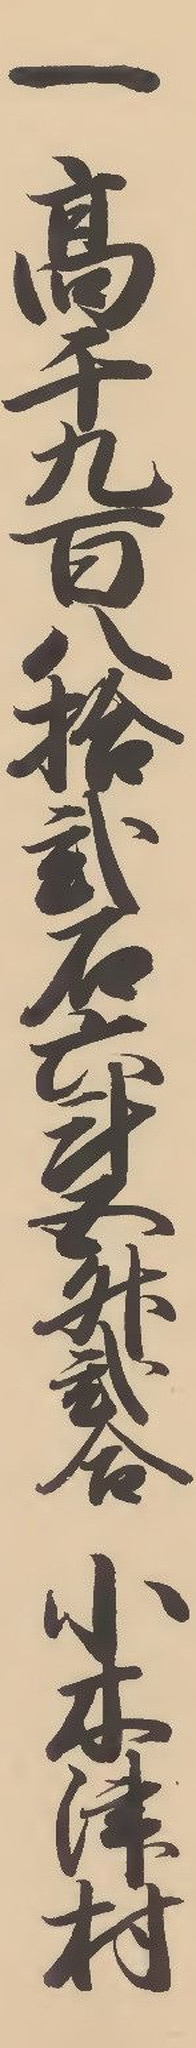一高千九百八拾弐石六斗五升弐合小木津村
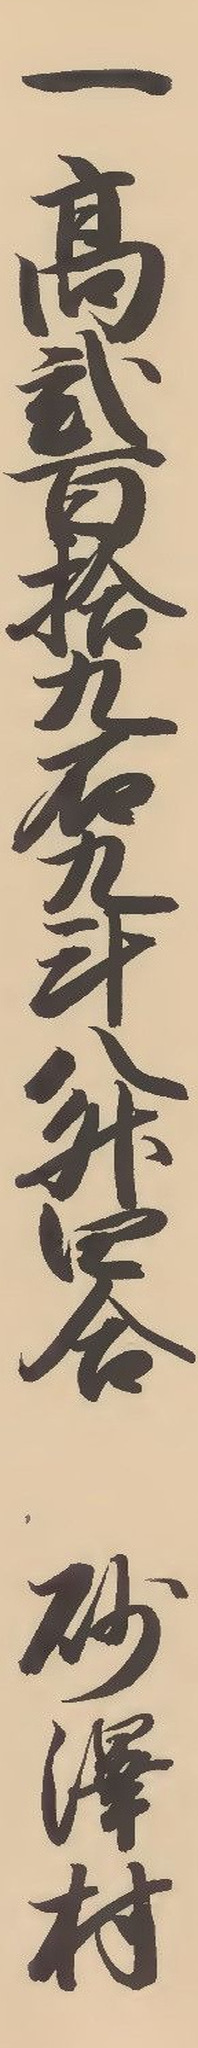一高弐百拾九石九斗八升四合砂沢村
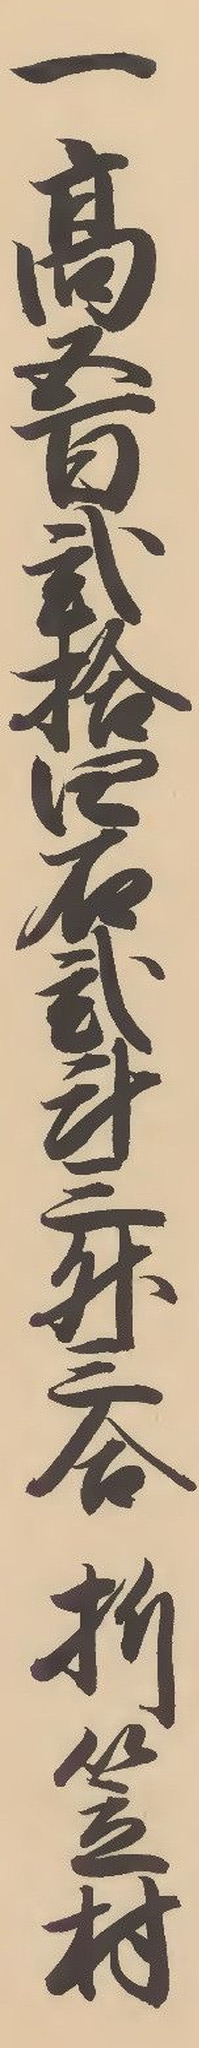一高五百弐拾四石弐斗三升三合折笠村

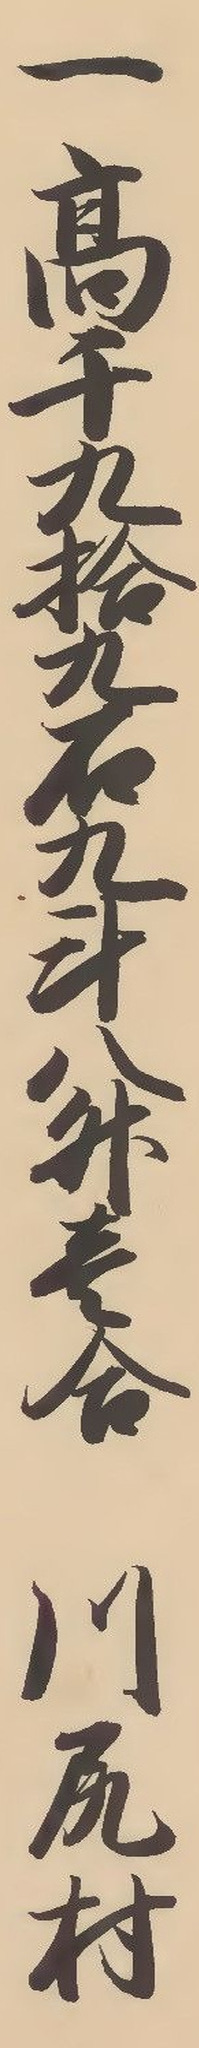一高千九拾九石九斗八升壱合川尻村
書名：常陸国郷帳
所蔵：国立公文書館 National Archives of Japan
